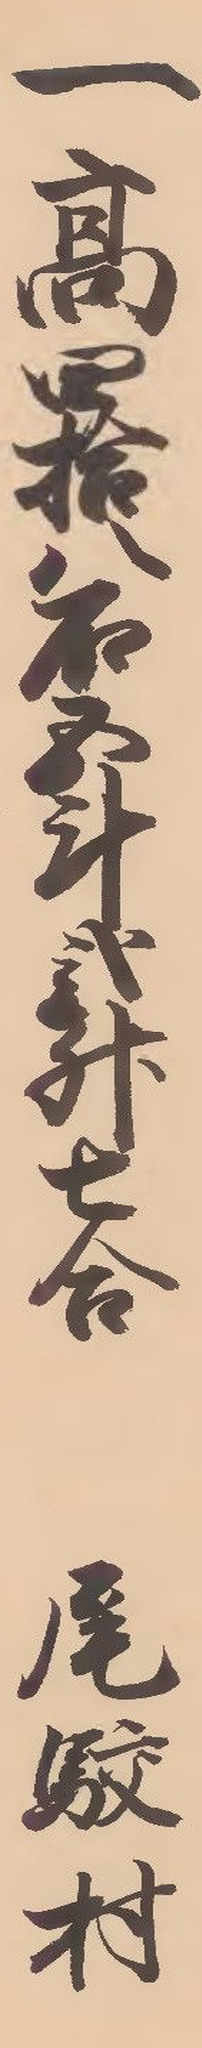一高四拾八石五斗弐升七合尾駮村

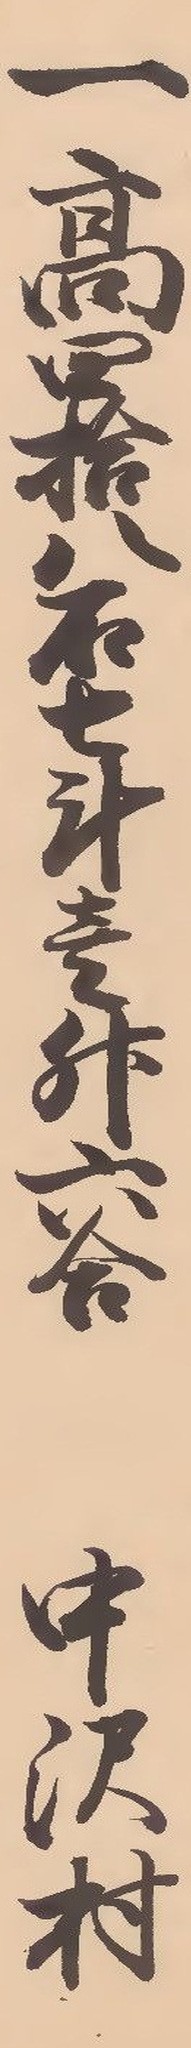一高四拾八石七斗壱升六合中沢村
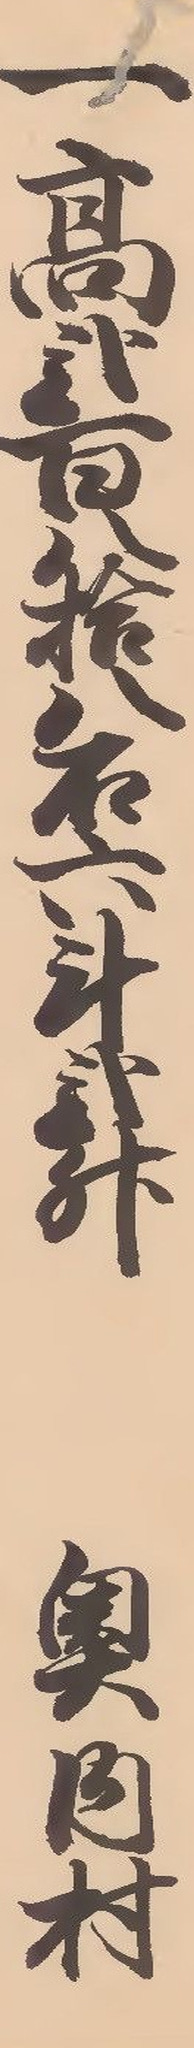一高弐百八拾八石六斗弐升奥内村
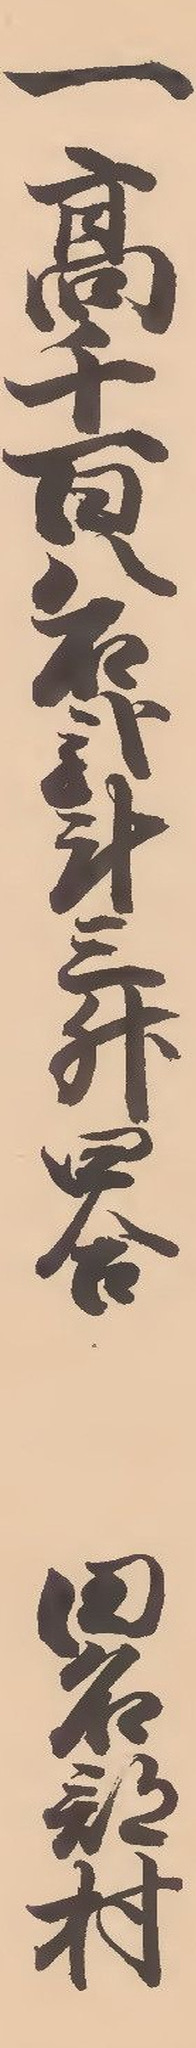一高千百八石弐斗三升四合田名部村
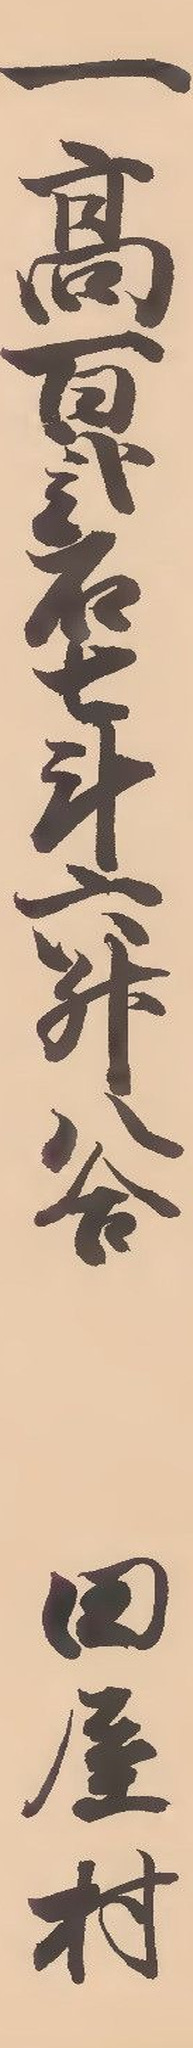一高百弐石七斗六升八合田屋村
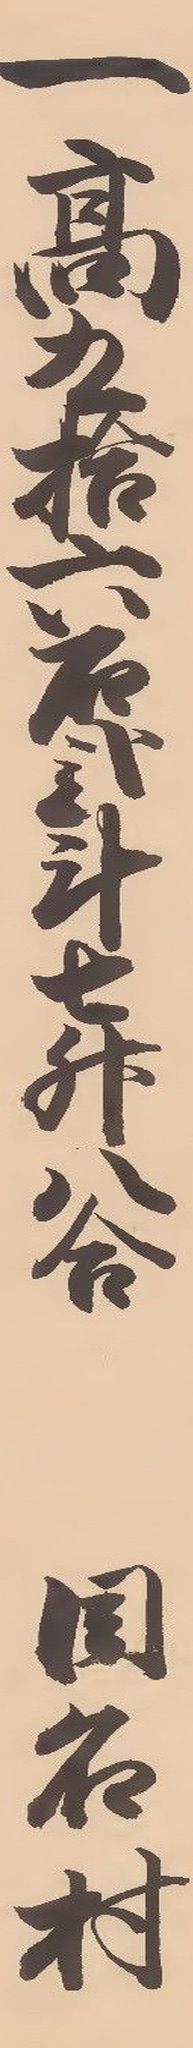一高九拾六石弐斗七升八合目名村
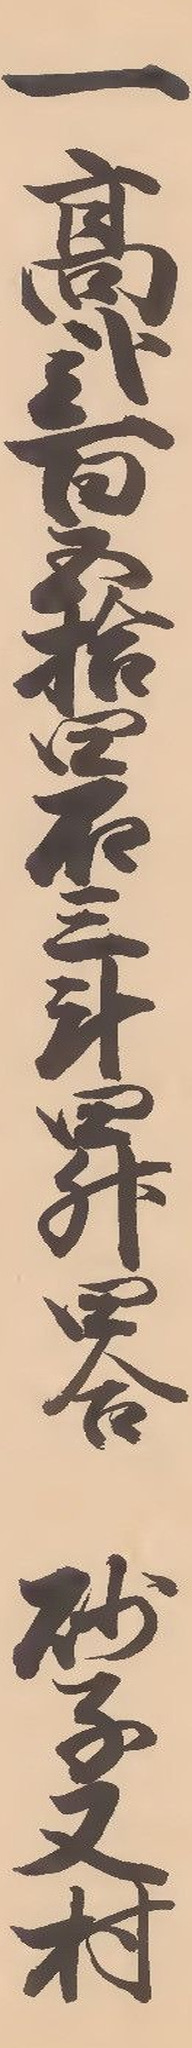一高弐百五拾四石三斗四升四合砂子又村
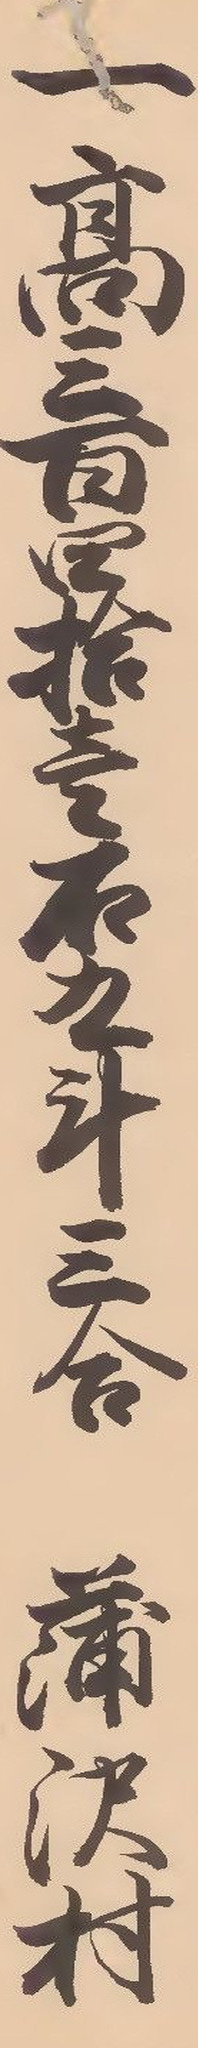一高三百四拾壱石九斗三合蒲沢村
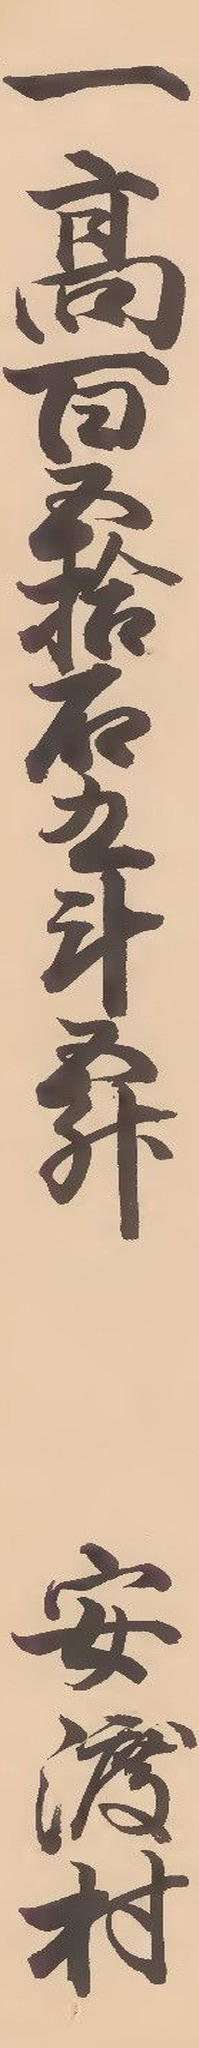一高百五拾石九斗五升安渡村

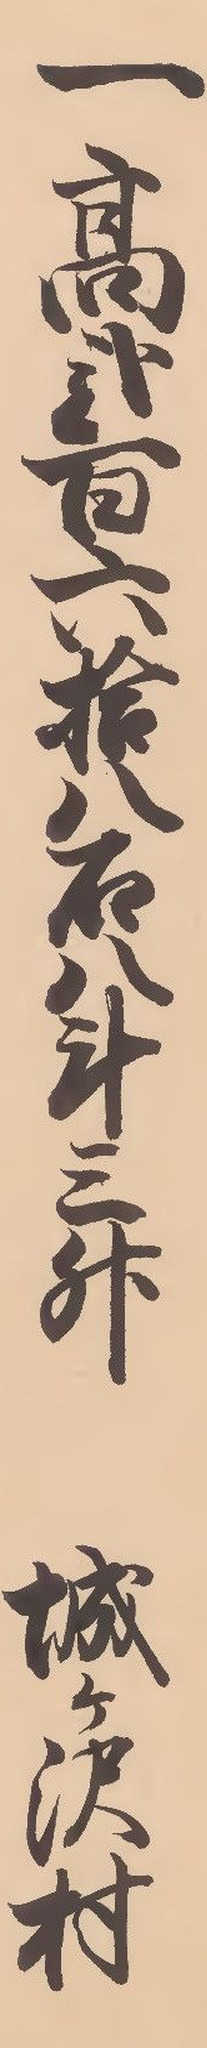一高弐百六拾八石八斗三升城ヶ沢村
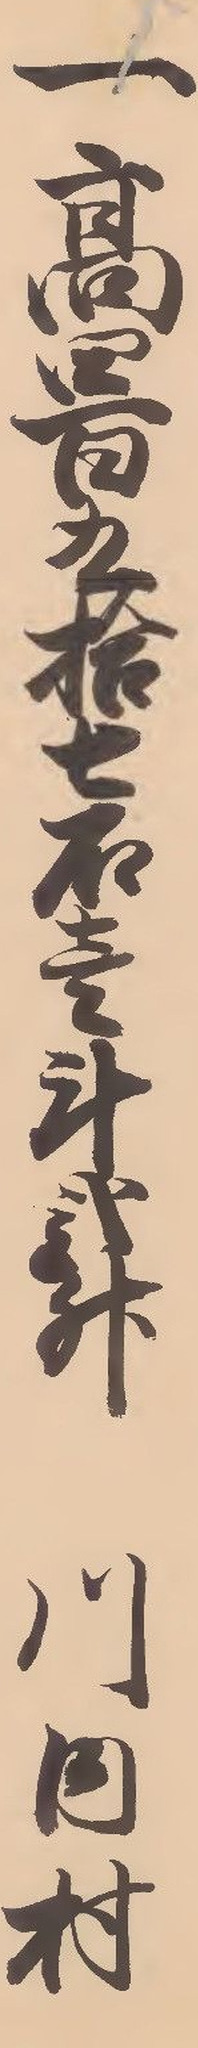一高四百九拾七石壱斗弐升川内村
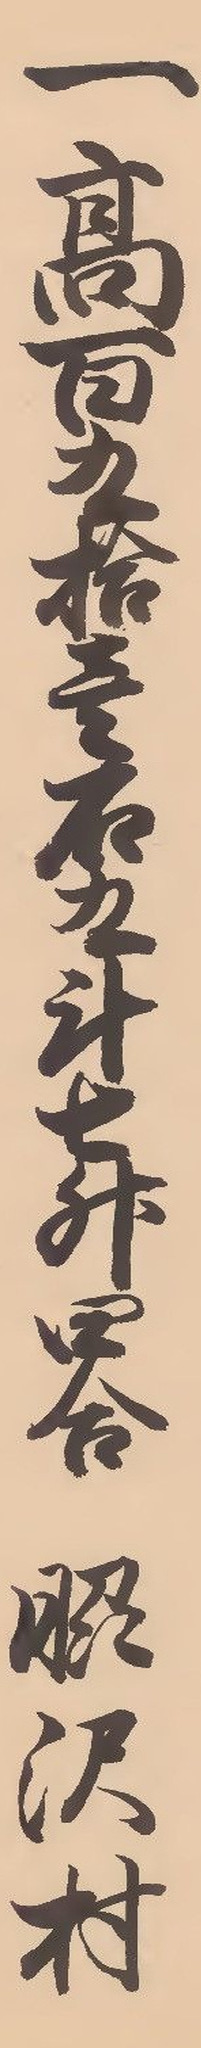一高百九拾壱石九斗七升四合脇沢村
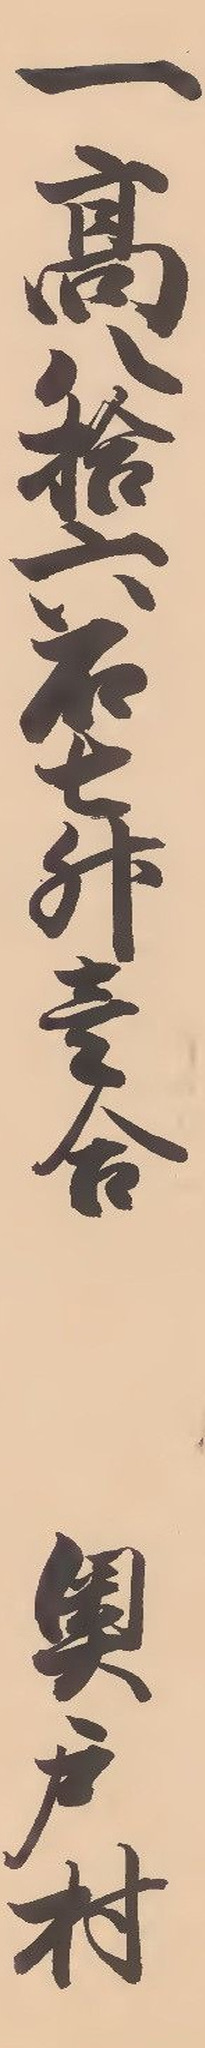一高八拾六石七升壱合奥戸村
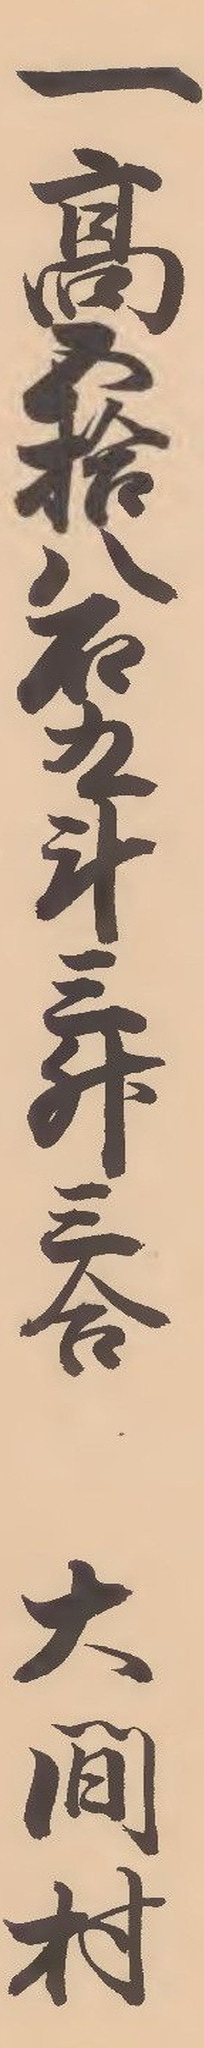一高五拾八石九斗三升三合大間村
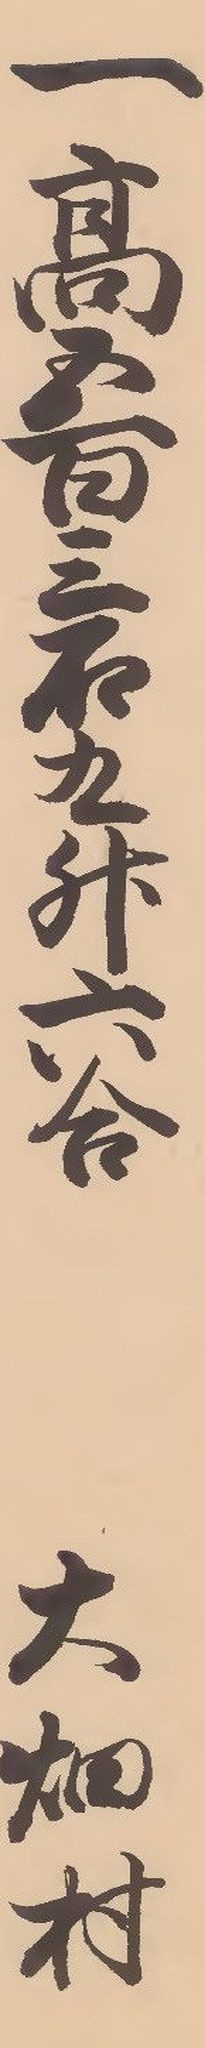一高五百三石九升六合大畑村
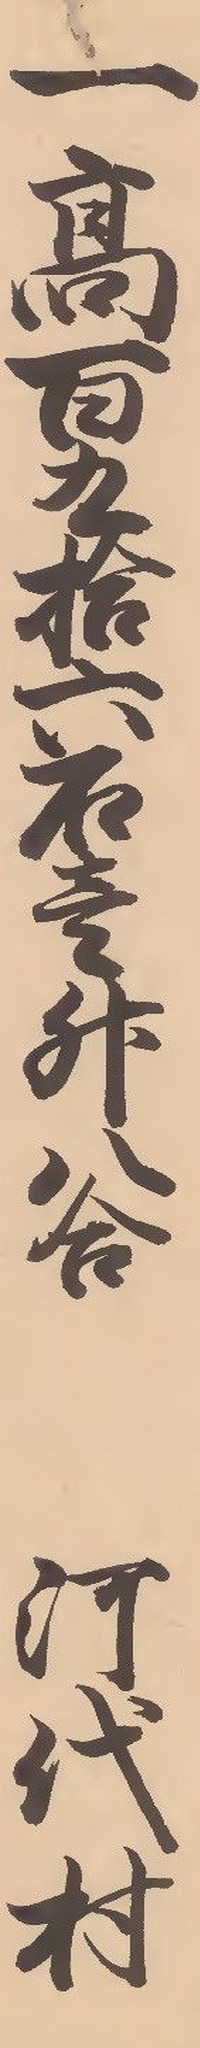一高百九拾六石壱升八合河代村
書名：陸奥国郷帳　６
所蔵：国立公文書館 National Archives of Japan
